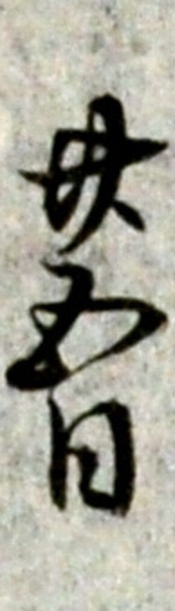廿五日
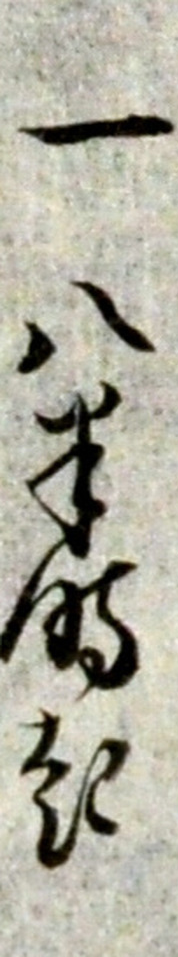一八半時起
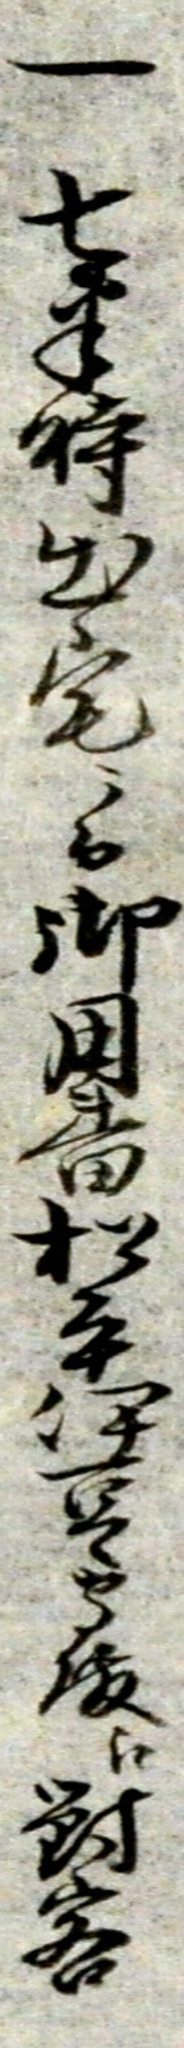一七半時出宅ニ而御用番松平伊豆守殿江対客
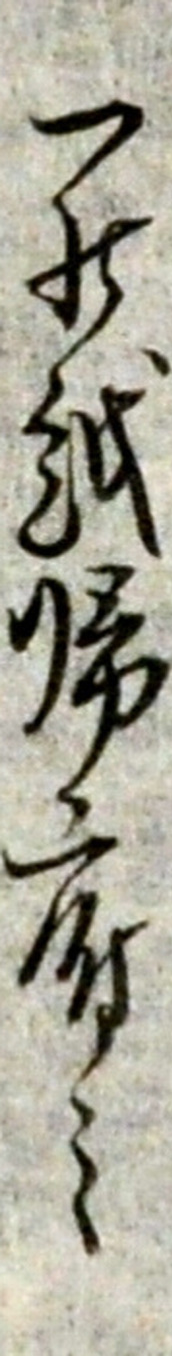罷越帰府之
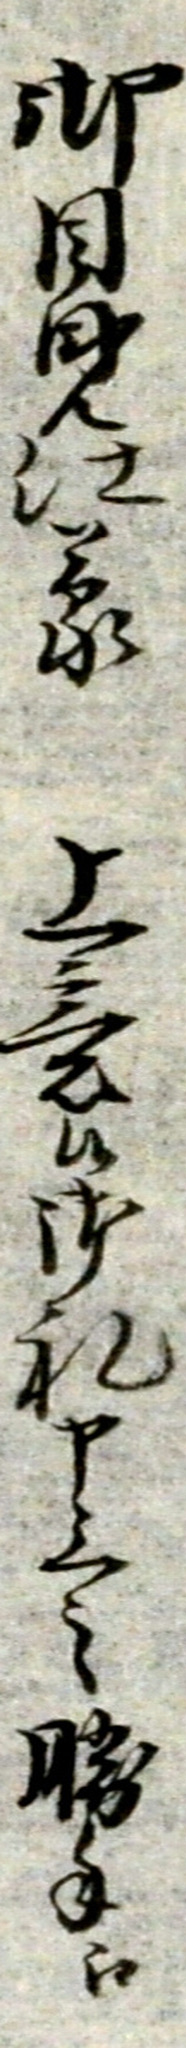御目見仕蒙上意候御礼申上之勝手江
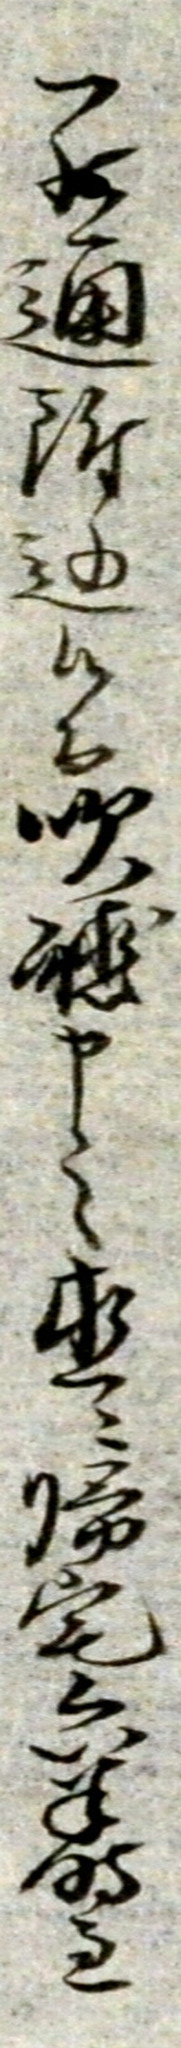罷通附込候而吹聴申候直ニ帰宅六半時過
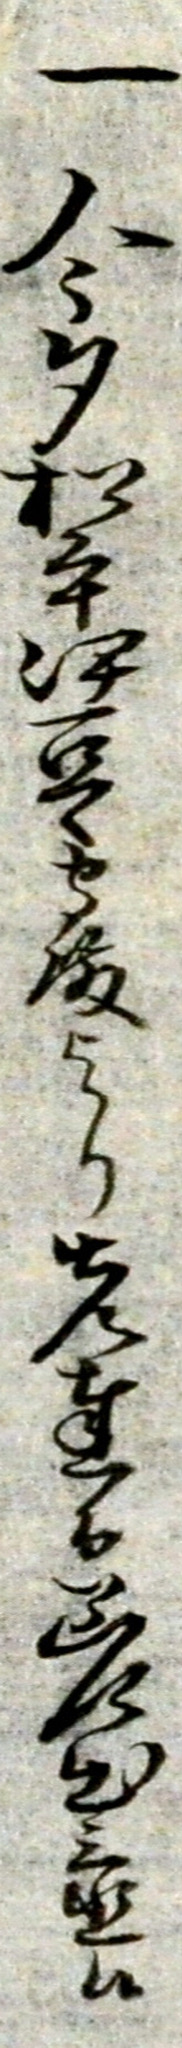一今夕松平伊豆守殿より先達而差出置候
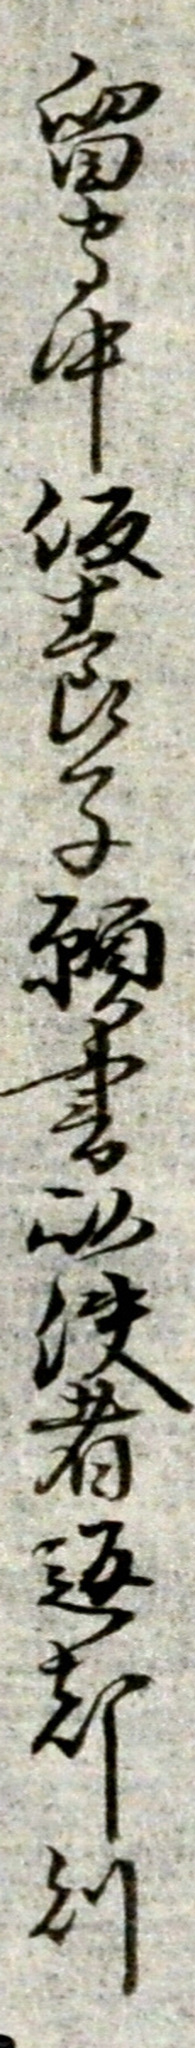留守中仮養子願書以使者返却則
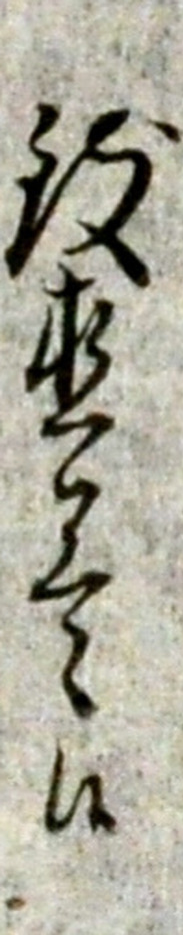致直答候
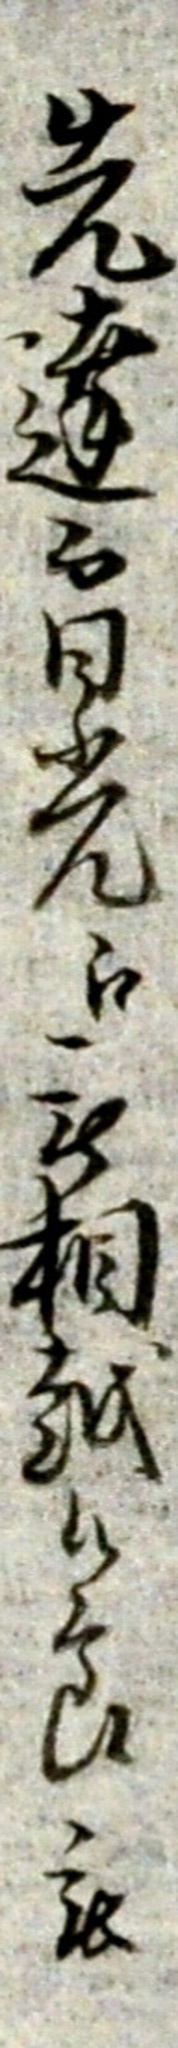先達而日光江被相越候節被
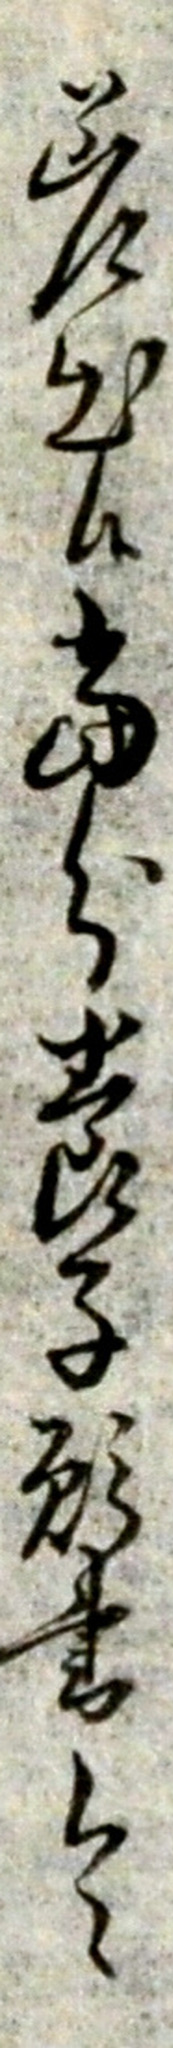差出候当分養子願書令
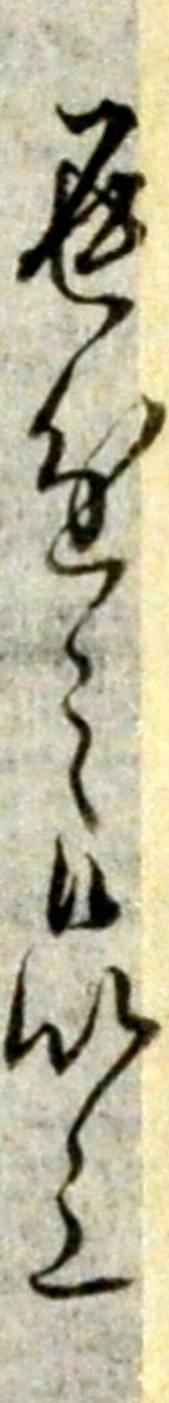返進之候以上
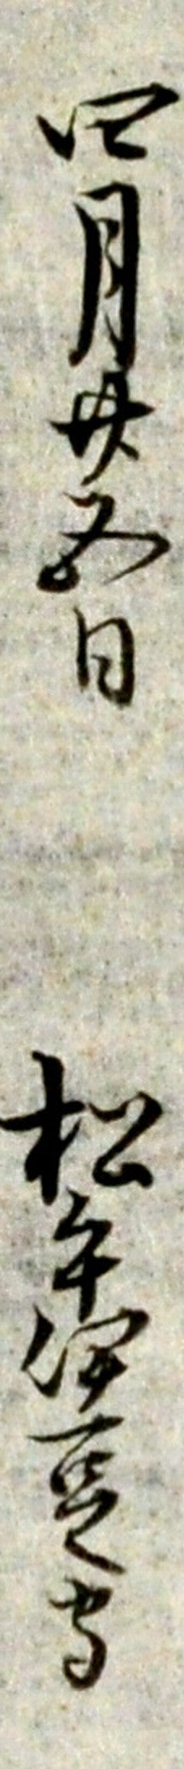四月廿五日松平伊豆守
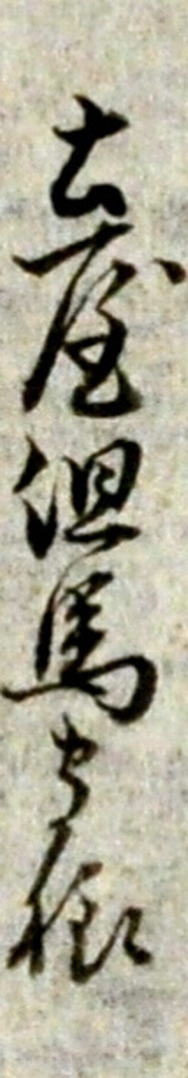土屋但馬守様
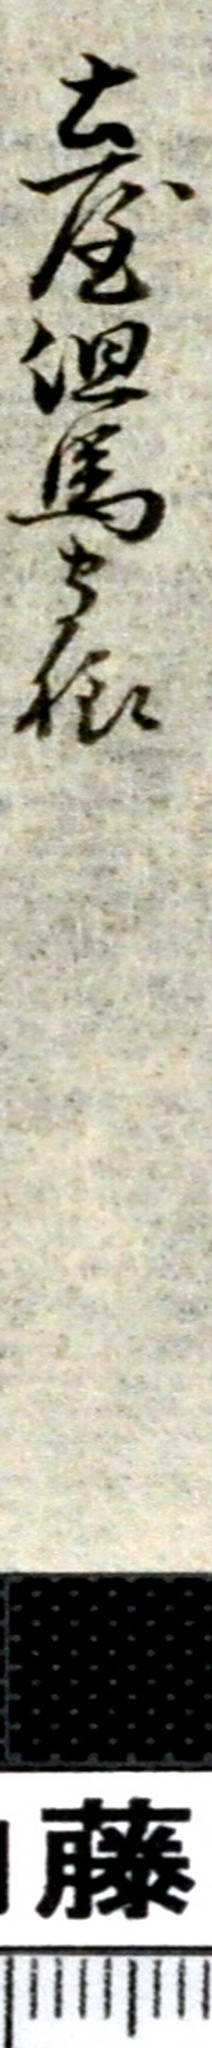土屋但馬守様

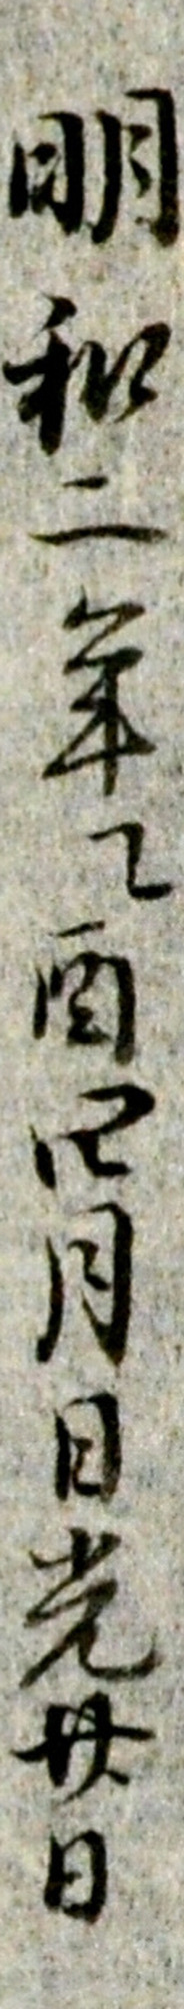明和二年乙酉四月日光廿日
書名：日光御名代相勤候節ノ留
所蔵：伊那市立高遠町図書館・合同会社AMANE
